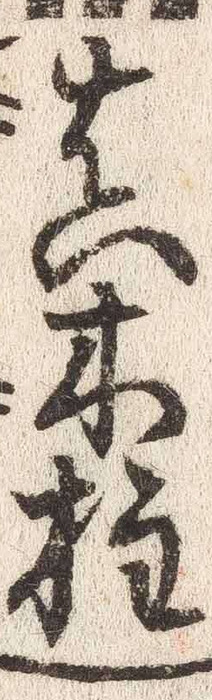真木柱
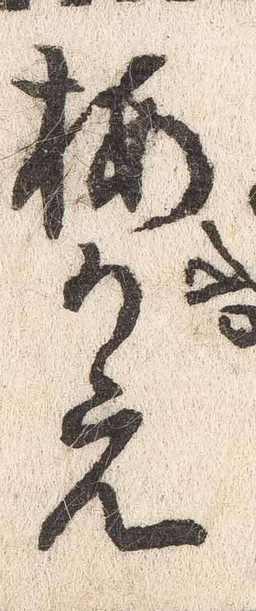梅かえ

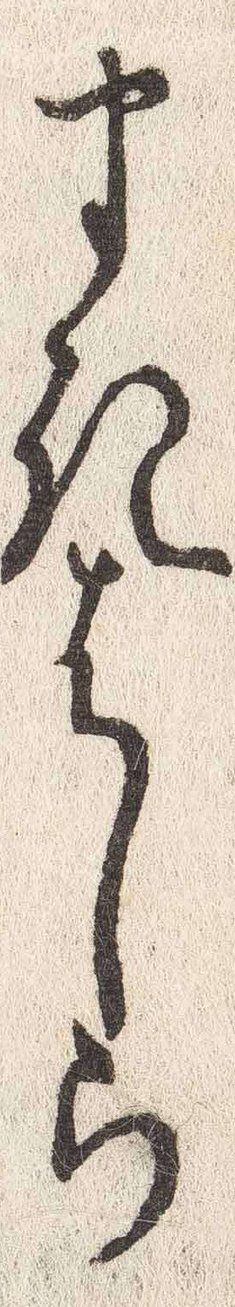まきはしら
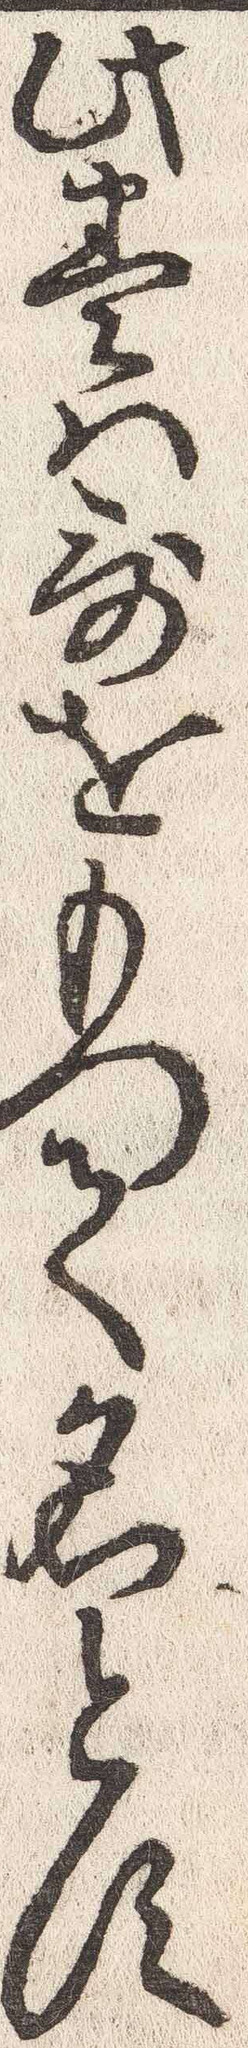此巻は歌をもつて名とす
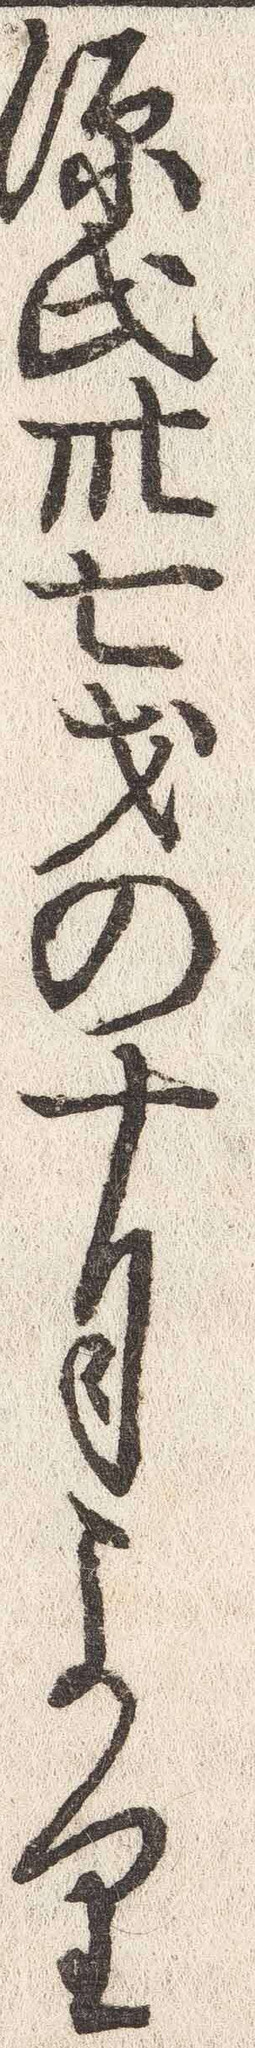源氏卅七才の十月より
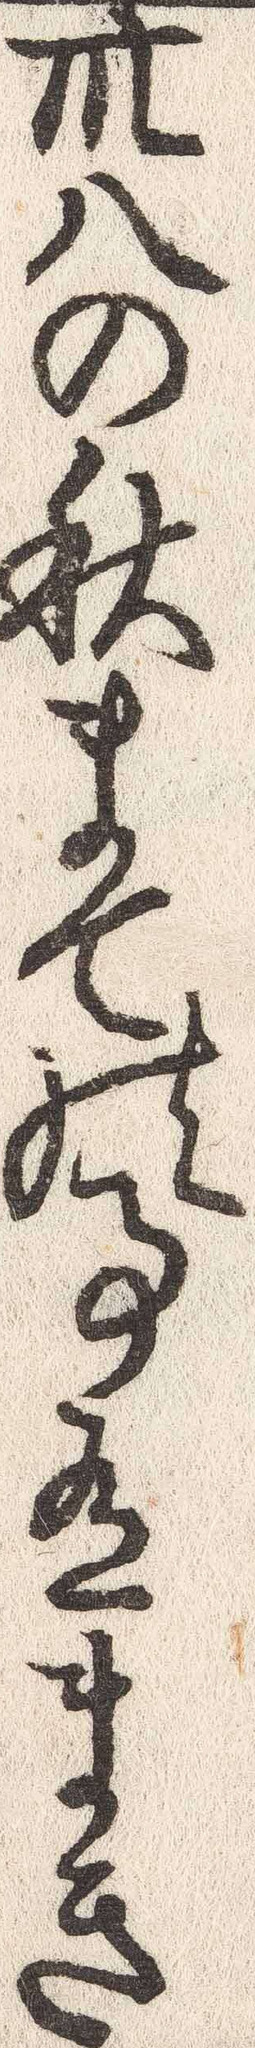卅八の秋まての事有まき
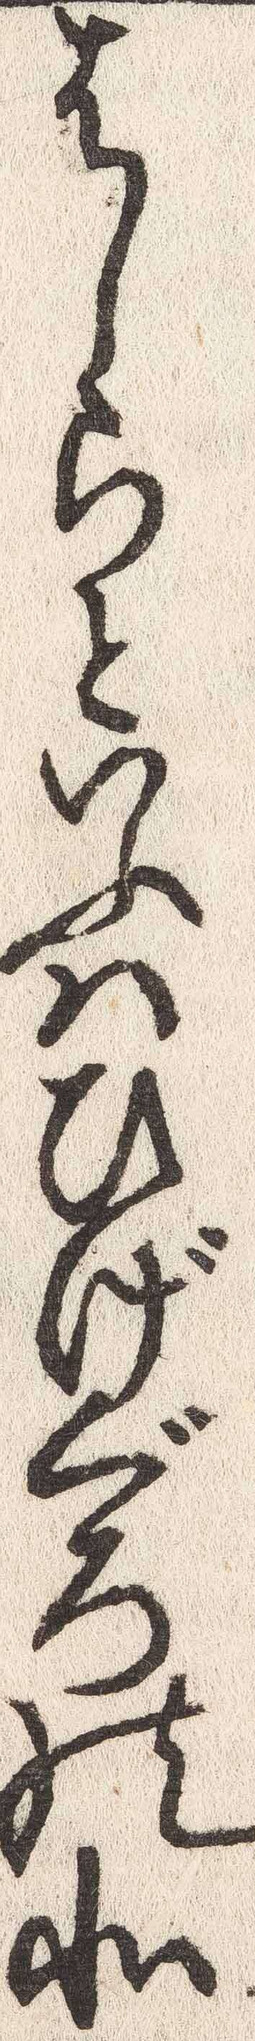はしらといふはひげぐろの北
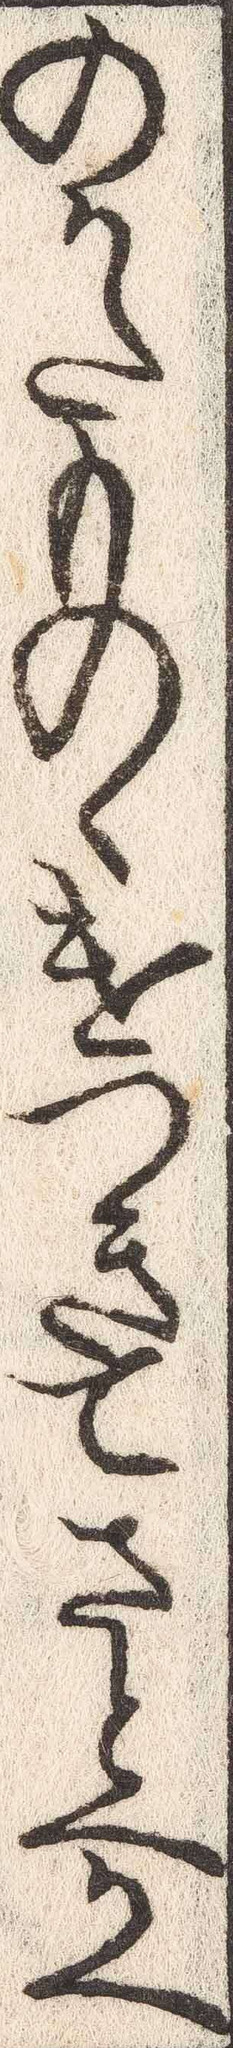のかたものゝけつきてさとへかへ
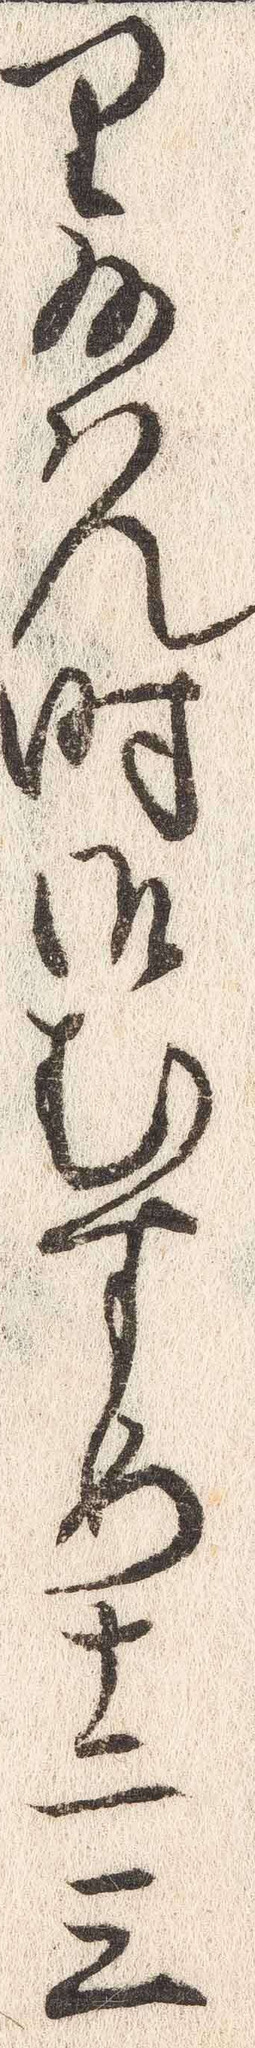り給はん時御むすめ十二三
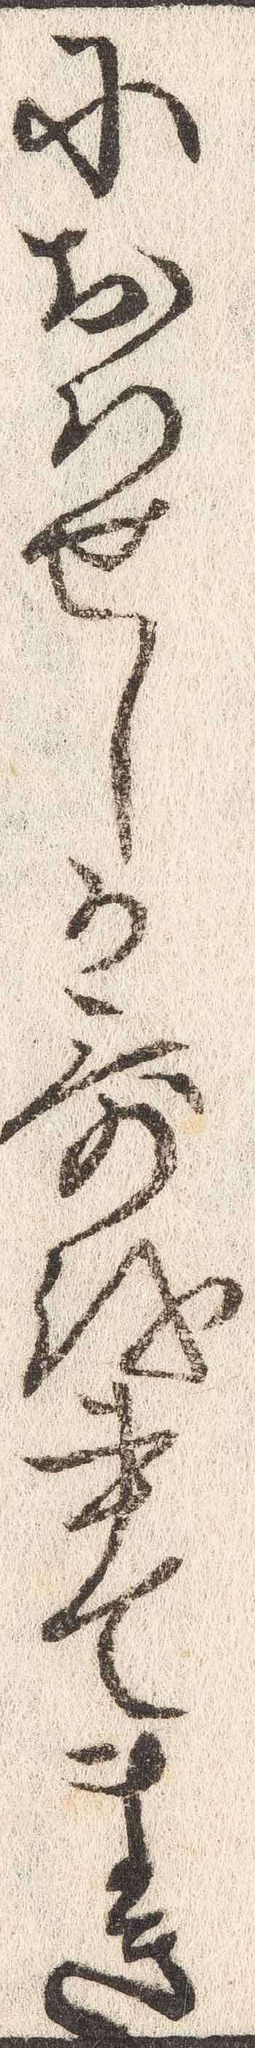におはせしか歌を書てまき
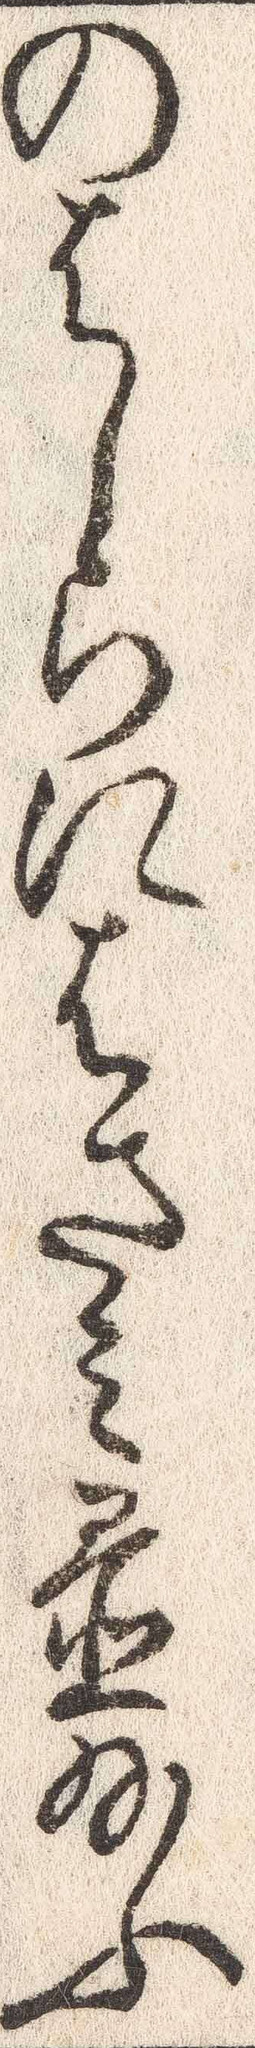のはしらにはさみ置給ふ
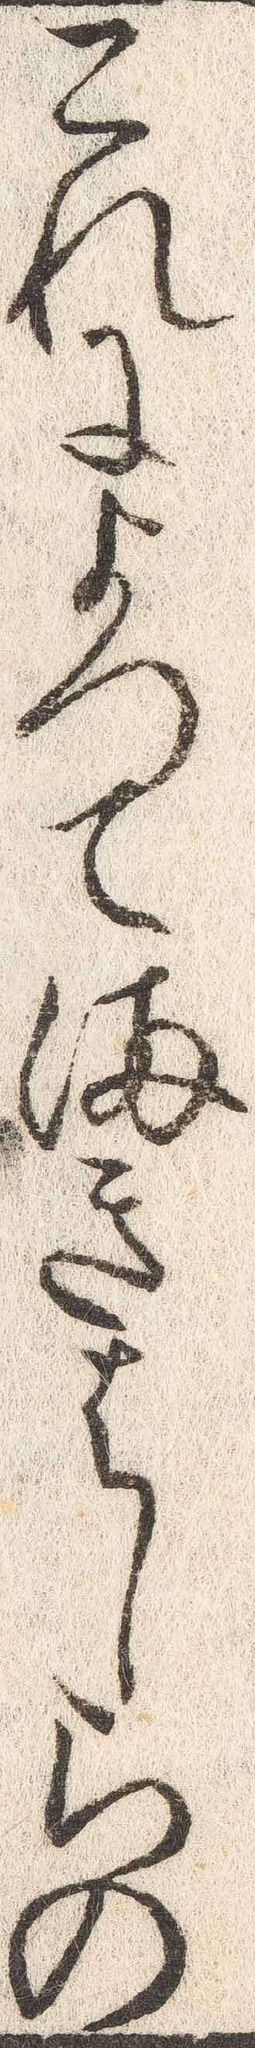これによつてまきはしらの

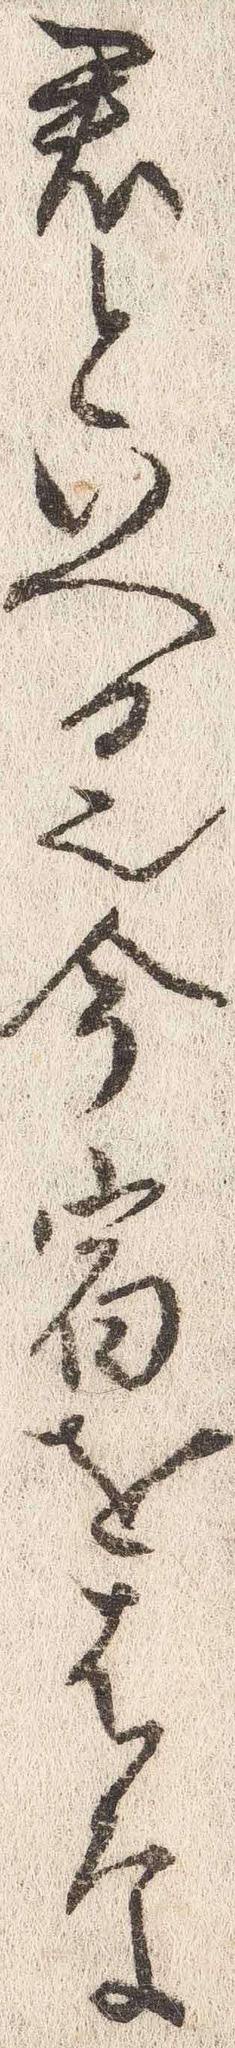君といへる也今宿をはな
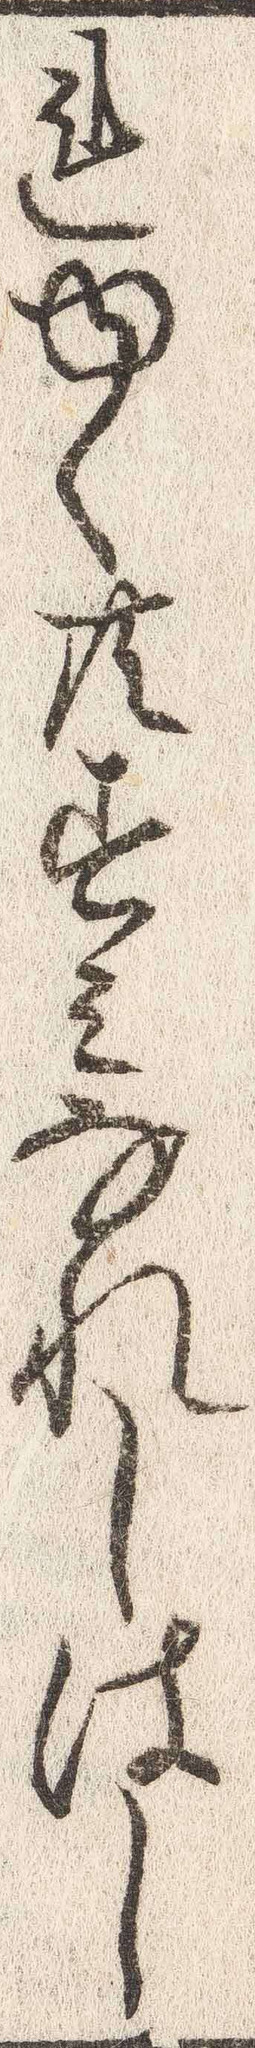れゆく共すみなれしはし
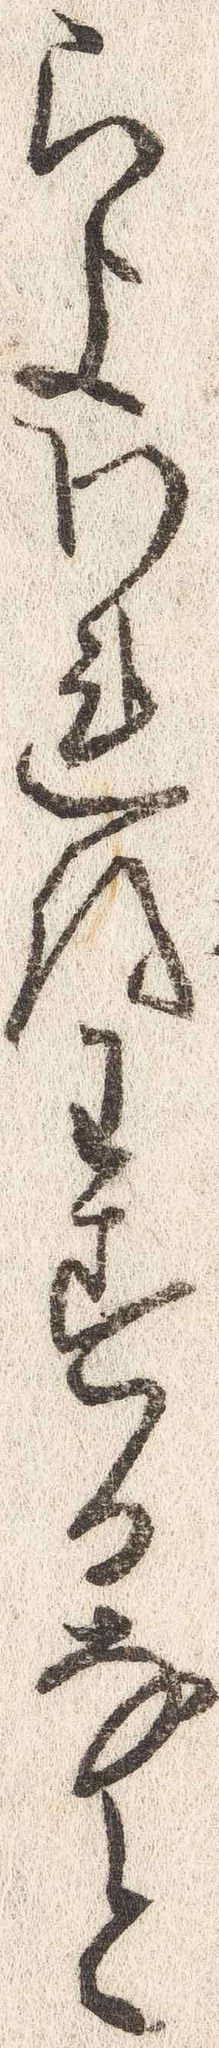らよわれをわするなと
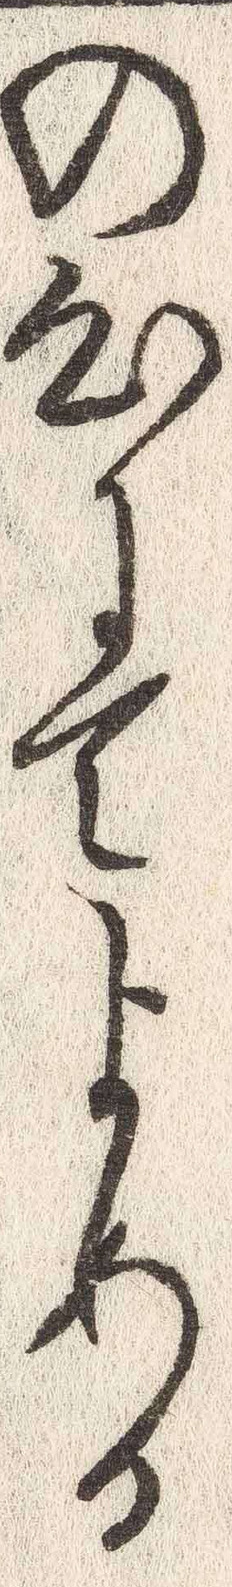の心にてよめる
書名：源氏物語
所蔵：東京学芸大学附属図書館 国文学研究資料館
